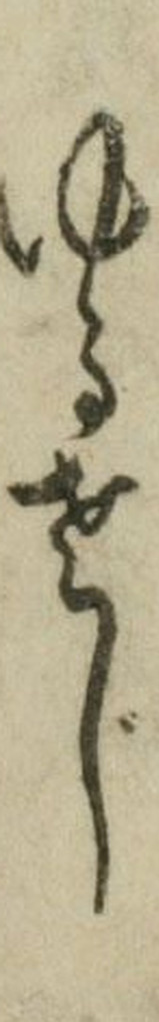ゆるさじ
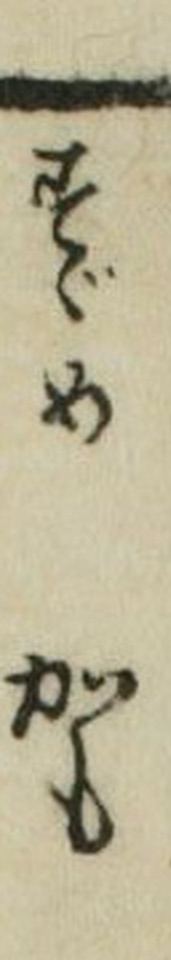すゞめかも
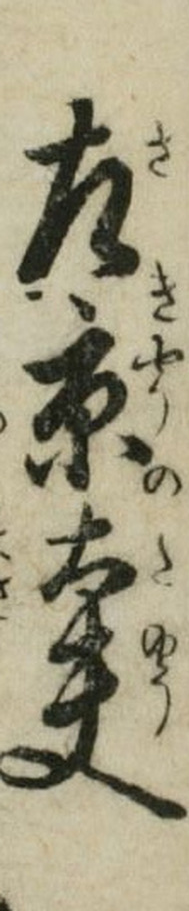左京大夫
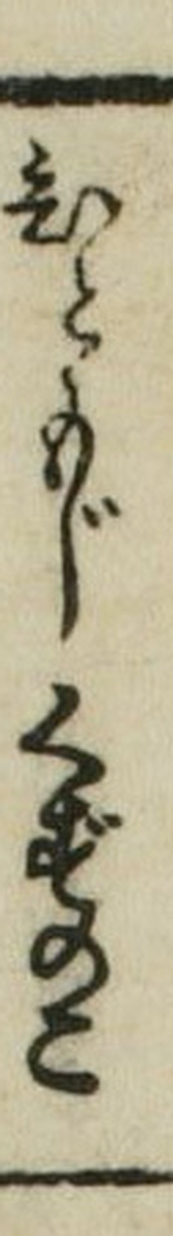ひともじくずのこ
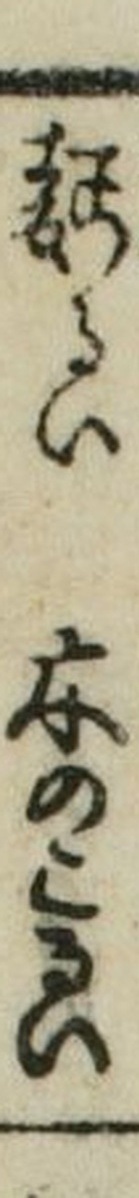麪るい木のこるい
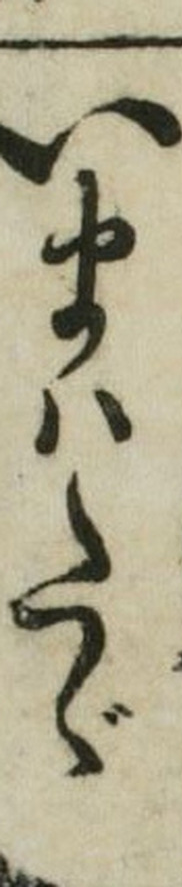いまはたゞ
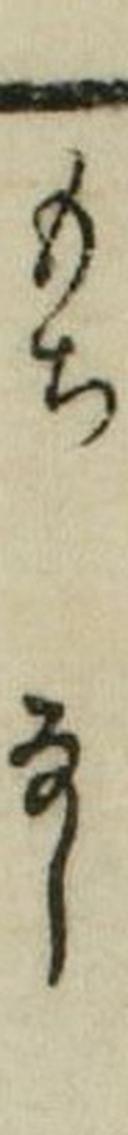もちなし
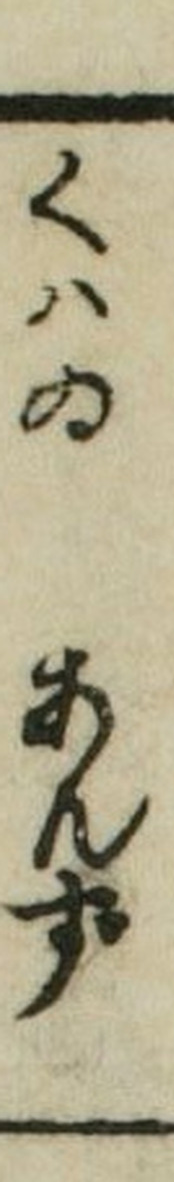くはゐあんず
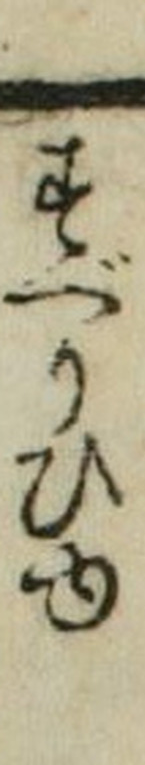すべりひゆ
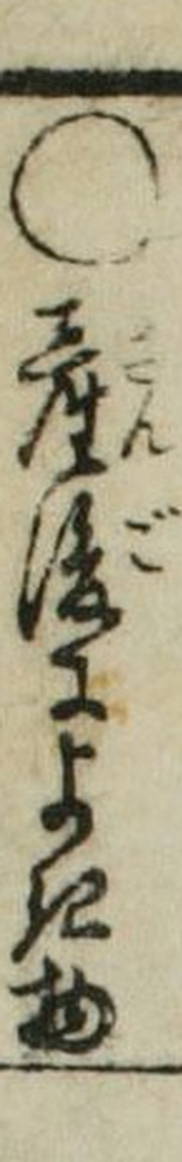○産後によき物
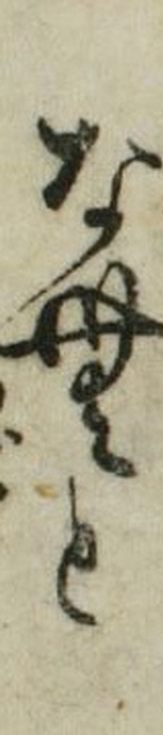なむと
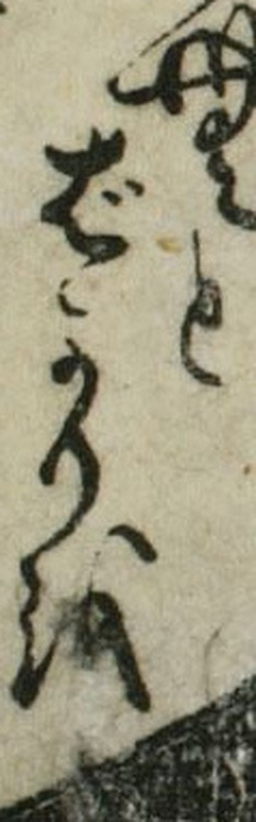ばかりを
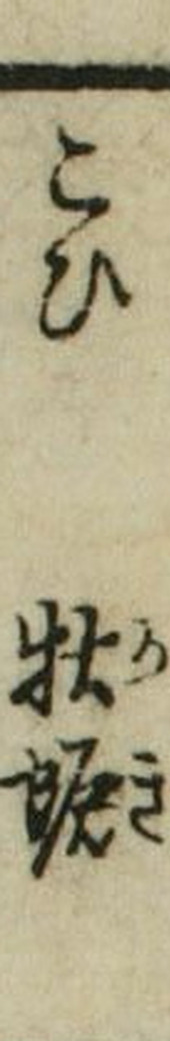こひ牡蛎
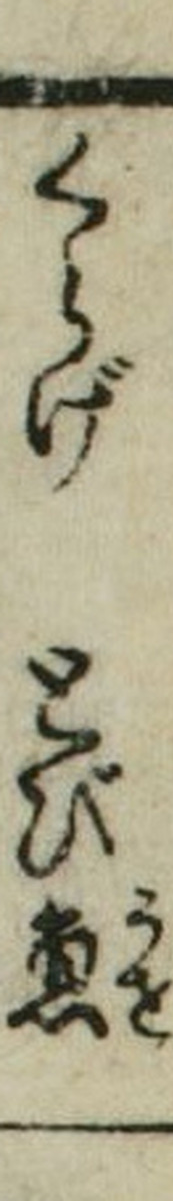くらげとび魚
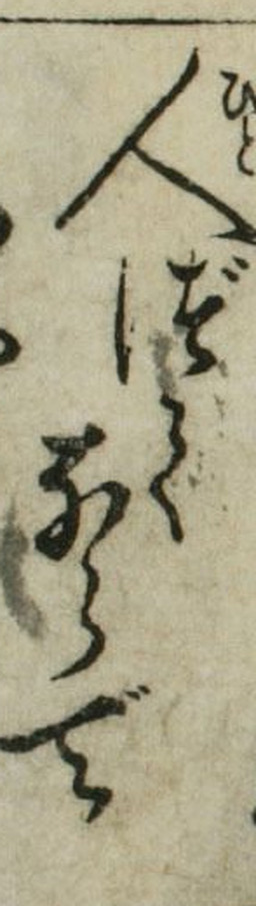ならで
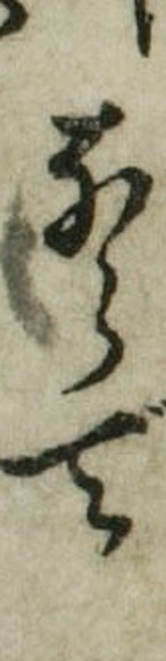ならで
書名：百人一首
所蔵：東京学芸大学教育コンテンツアーカイブ
